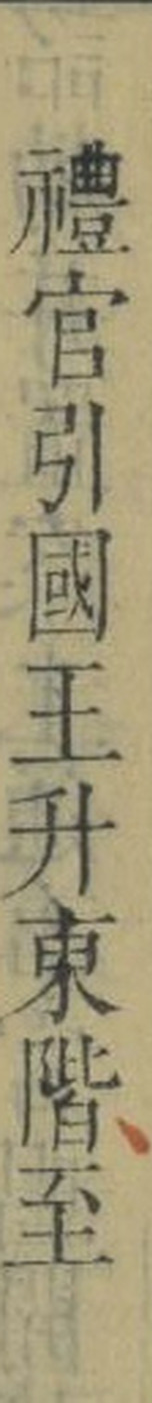禮官引國王升東階至
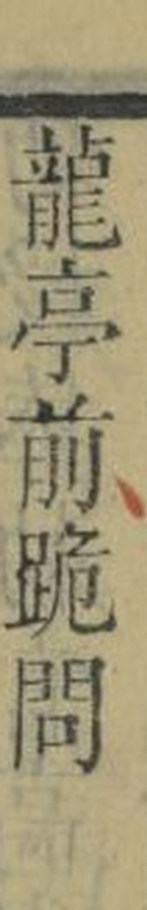龍亭前跪問
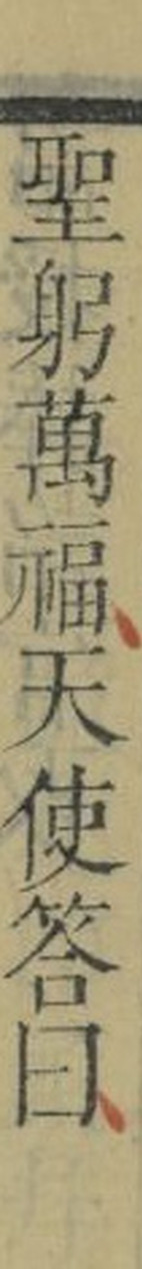聖躬萬福天使答曰
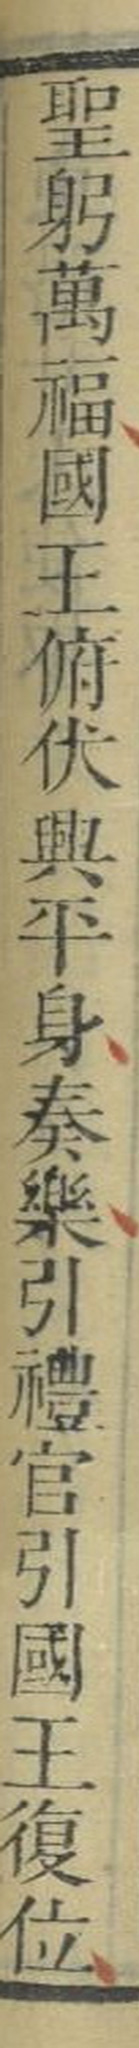聖躬萬福國王俯伏興平身奏樂引禮官引國王復位
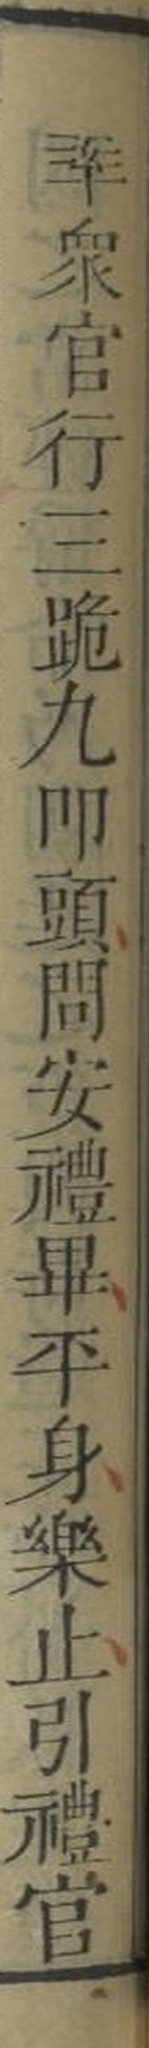率衆官行三跪九叩頭問安禮畢平身樂止引禮官
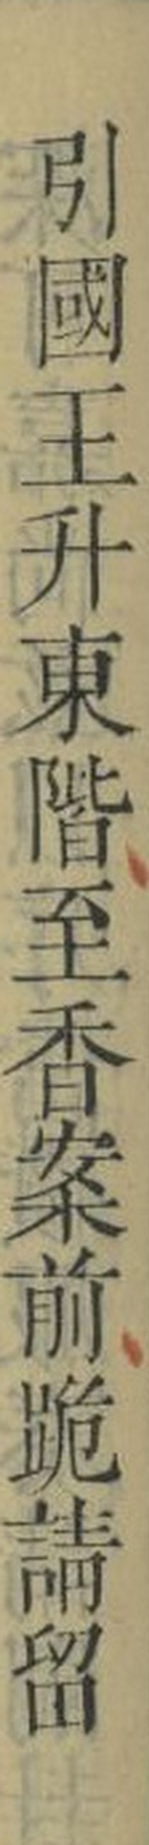引國王升東階至香案前跪請留
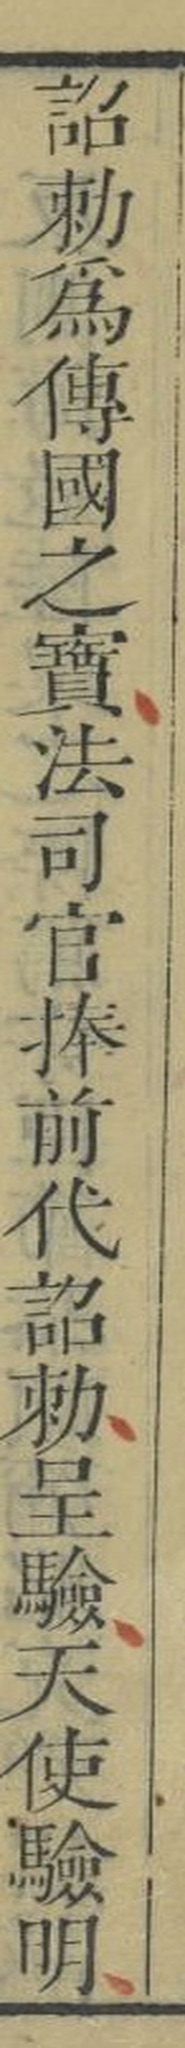詔勅爲傳國之寶法司官捧前代詔勅呈驗天使驗明
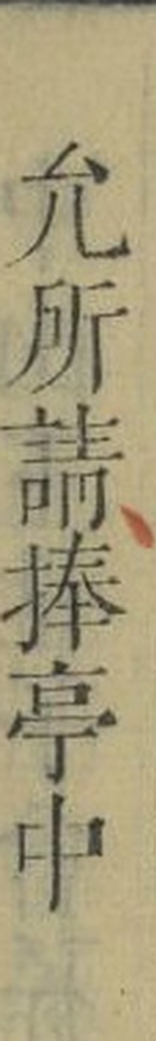允所請捧亭中
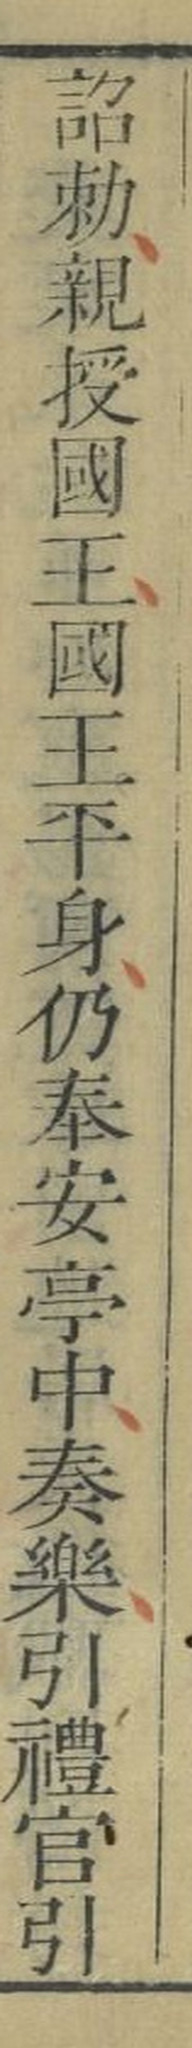詔勅親授國王國王平身仍奉安亭中奏樂引禮官引
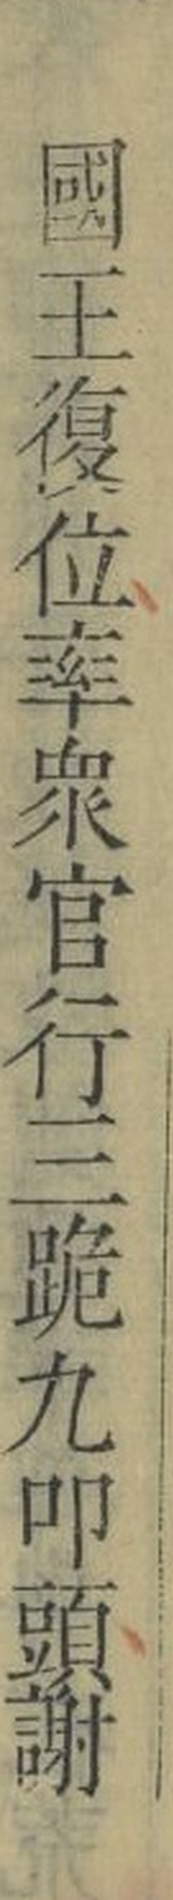國王復位率衆官行三跪九叩頭謝
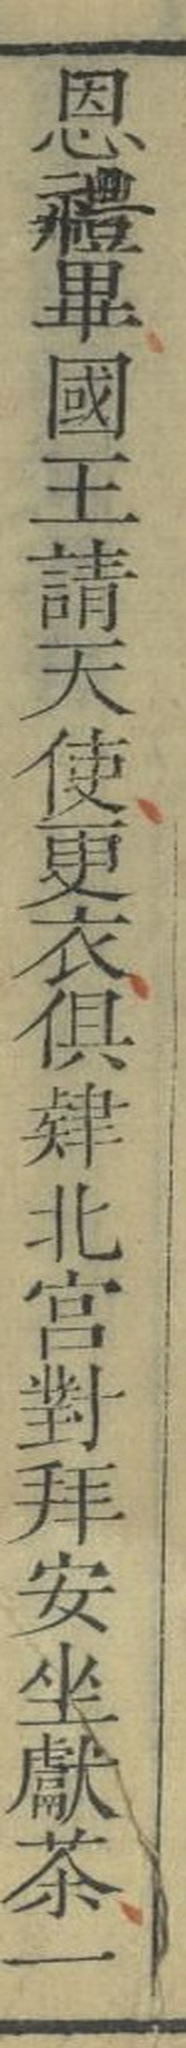恩禮畢國王請天使更衣倶肄北宫對拜安坐獻茶一
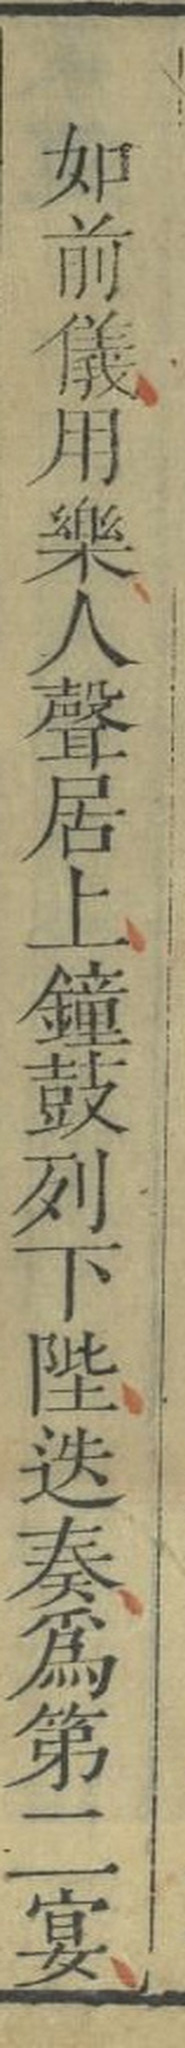如前儀用樂人聲居上鐘鼓列下陛迭奏爲第二宴
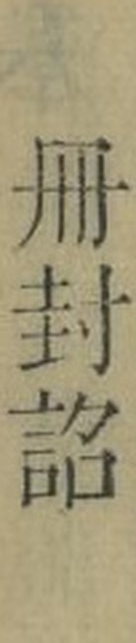冊封詔

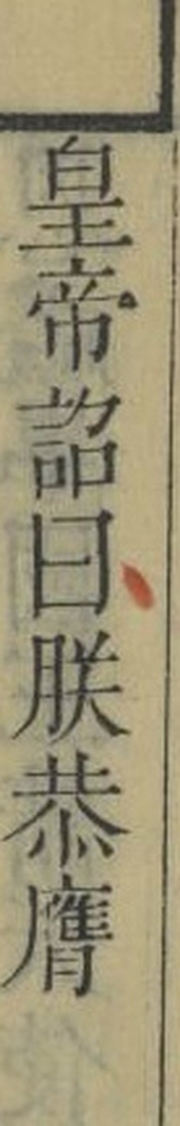皇帝詔曰朕恭膺
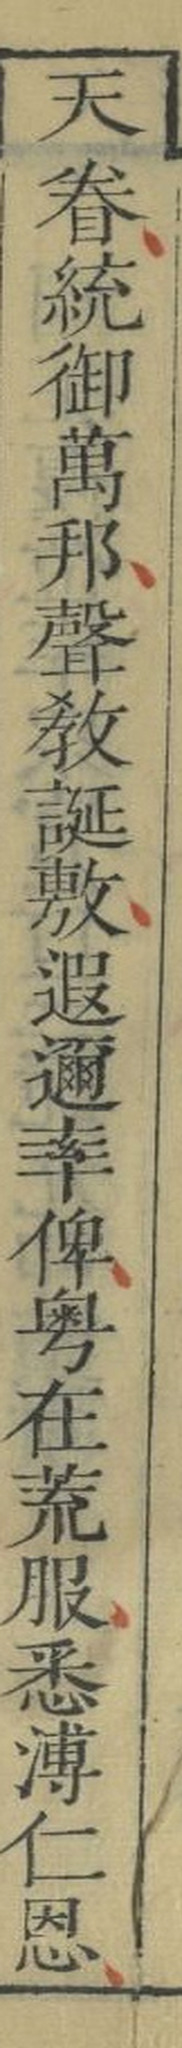天眷統御萬邦聲敎誕敷遐邇率俾粤在荒服悉溥仁恩
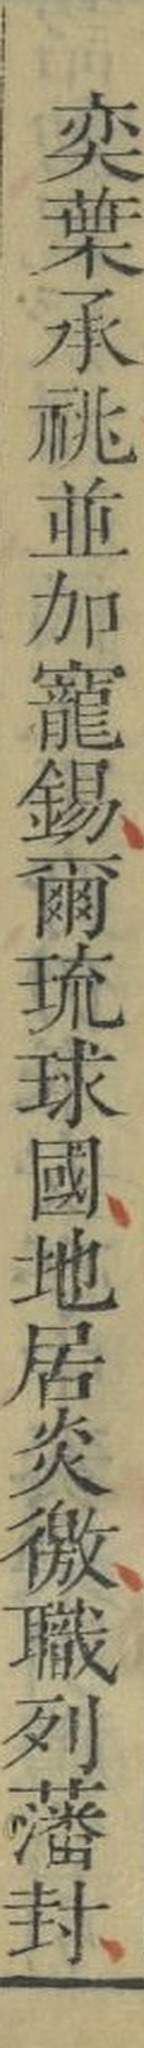奕葉承祧並加寵錫爾琉球國地居炎徼職列藩封
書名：中山伝信録 巻一、巻二
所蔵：University of the Ryukyus Library
